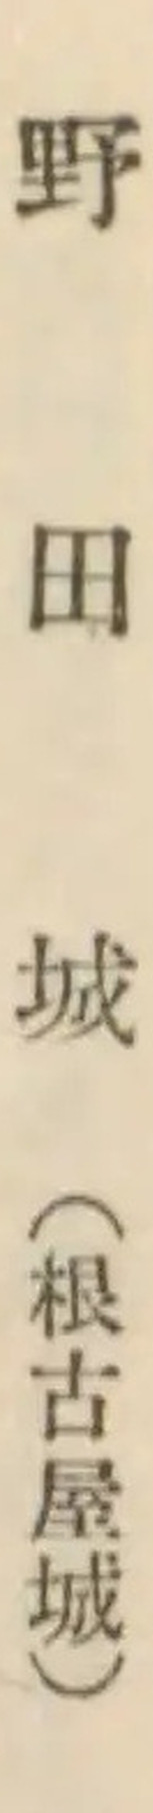野田城(根古屋城)
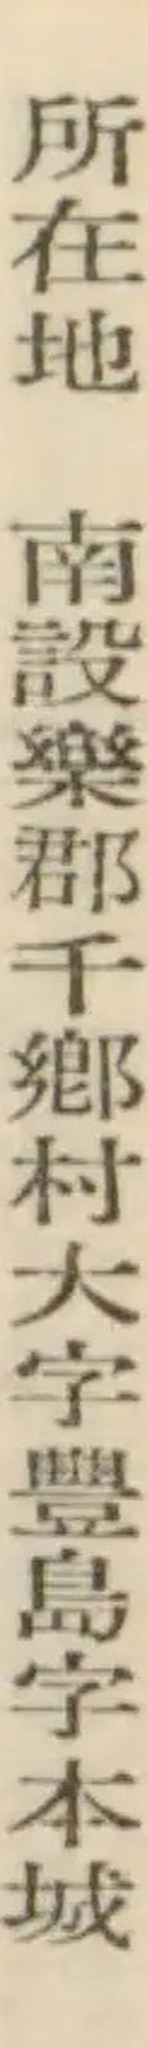所在地南設楽郡千郷村大字豊島字本城
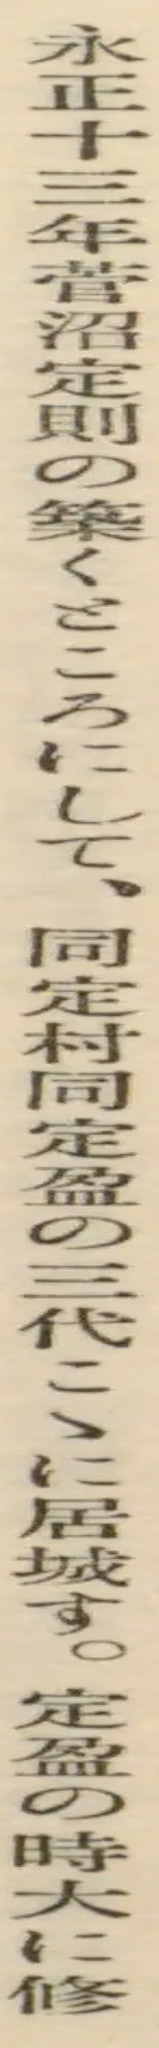永正十三年菅沼定則の築くところにして、同定村同定盈の三代こゝに居城す。定盈の時大に修
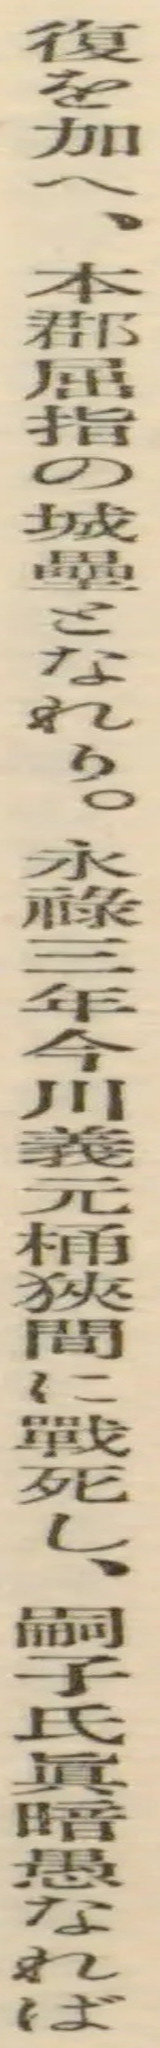復を加へ、本郡屈指の城塁となれり。永禄三年今川義元桶狭間に戦死し、嗣子氏実暗愚なれば
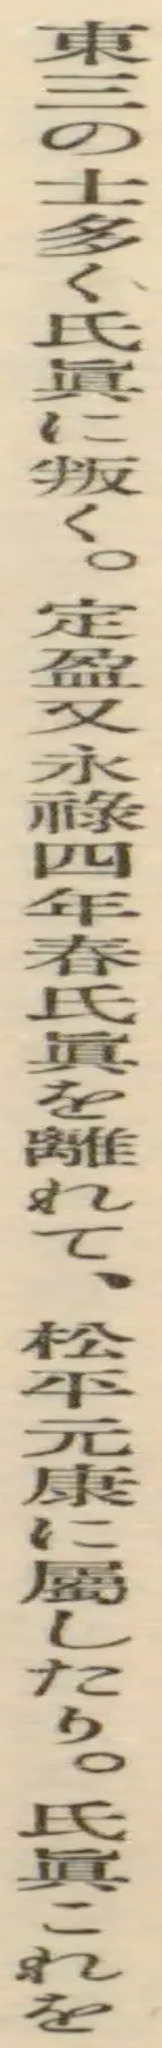東三の士多く氏真に叛く。定盈又永禄四年春氏真を離れて、松平元康に属したり。氏真これを
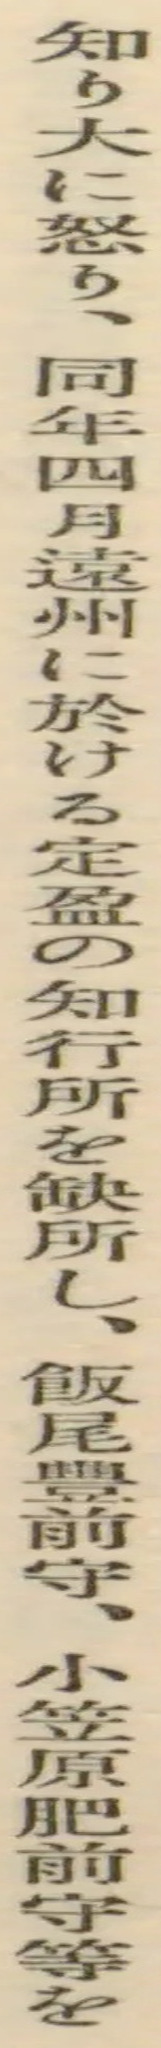知り大に怒り、同年四月遠州に於ける定盈の知行所を缺所し、飯尾豊前守、小笠原肥前守等を
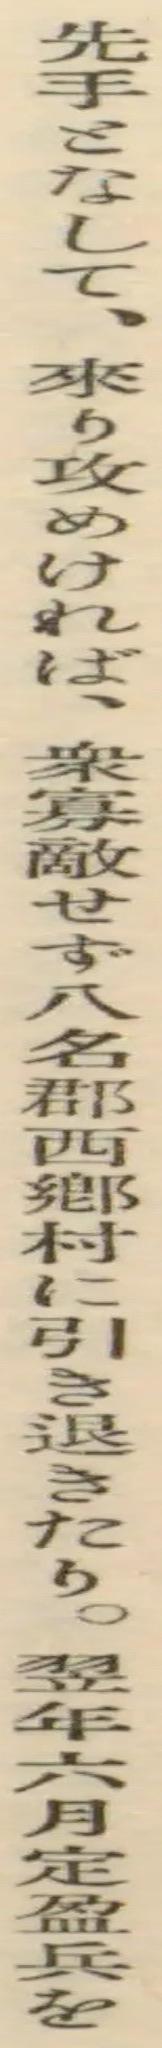先手となして、来り攻めければ、衆寡敵せず八名郡西郷村に引き退きたり。翌年六月定盈兵を
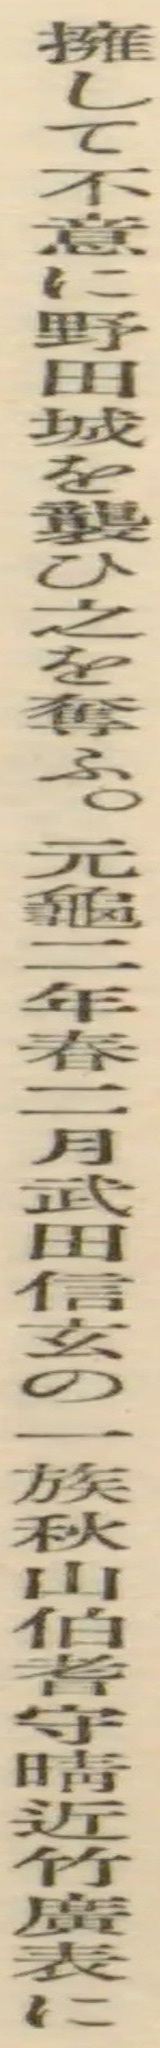擁して不意に野田城を襲ひ之を奪ふ。元亀二年春二月武田信玄の一族秋山伯耆守晴近竹広表に
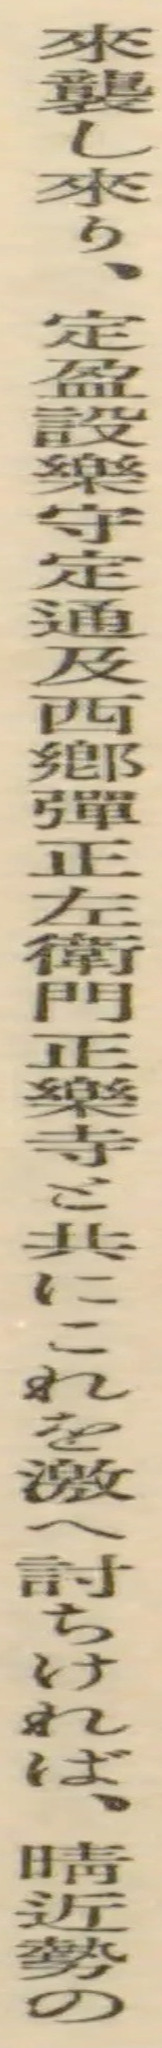来襲し来り、定盈設楽守定通及西郷弾正左衛門正楽寺と共にこれを激へ討ちければ、晴近勢の

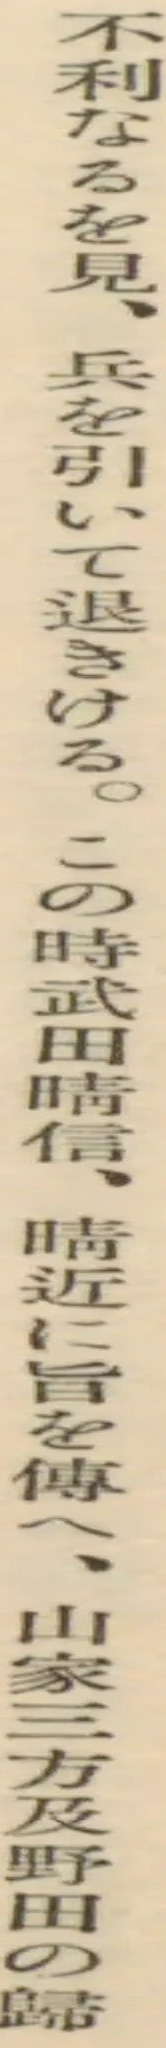不利なるを見、兵を引いて退きける。この時武田晴信、晴近に旨を伝へ、山家三方及野田の帰
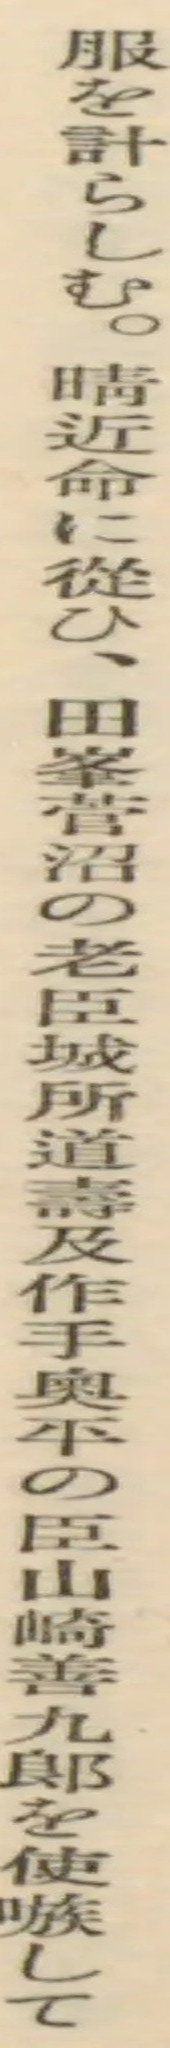服を計らしむ。晴近命に従ひ、田峯菅沼の老臣城所道寿及作手奥平の臣山崎善九郎を使嗾して
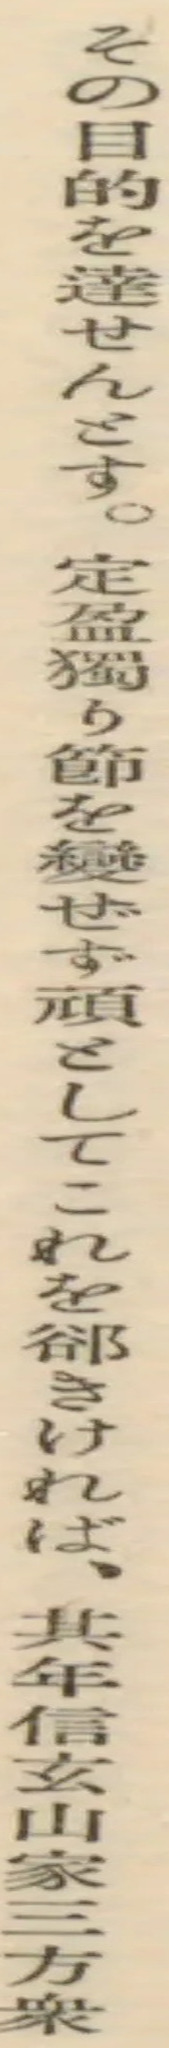その目的を達せんとす。定盈独り節を変ぜず頑としてこれを郤きければ、其年信玄山家三方衆
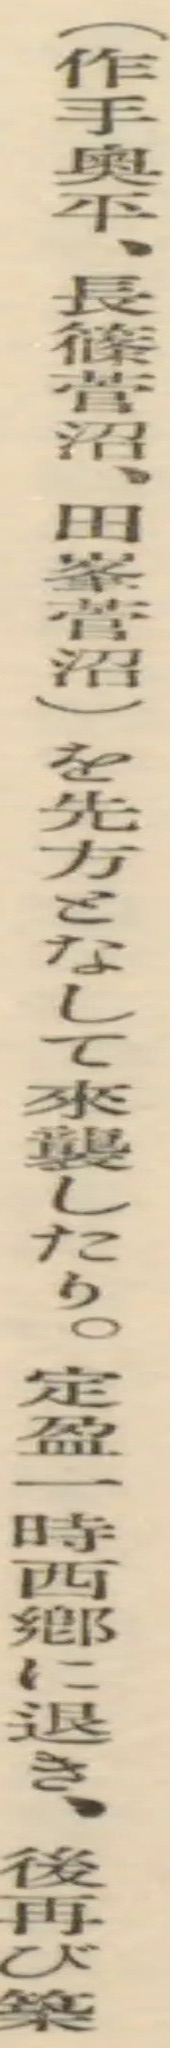(作手奥平、長篠菅沼、田峯菅沼)を先方となして来襲したり。定盈一時西郷に退き、後再び築
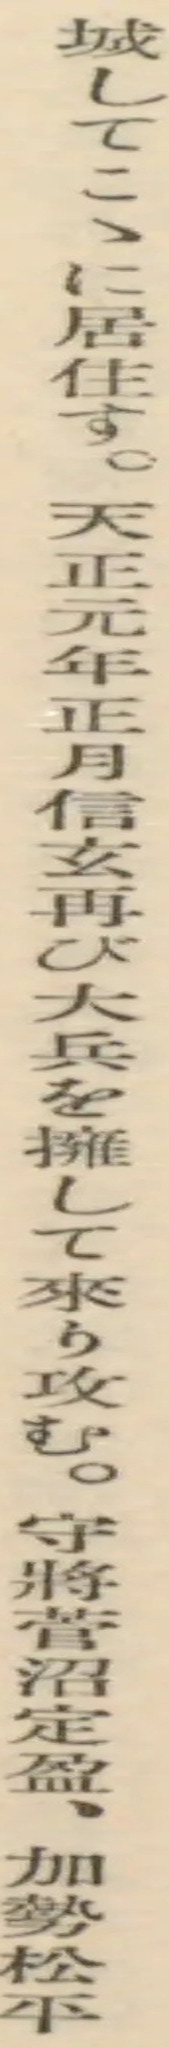城してこゝに居住す。天正元年正月信玄再び大兵を擁して来り攻む。守将菅沼定盈、加勢松平
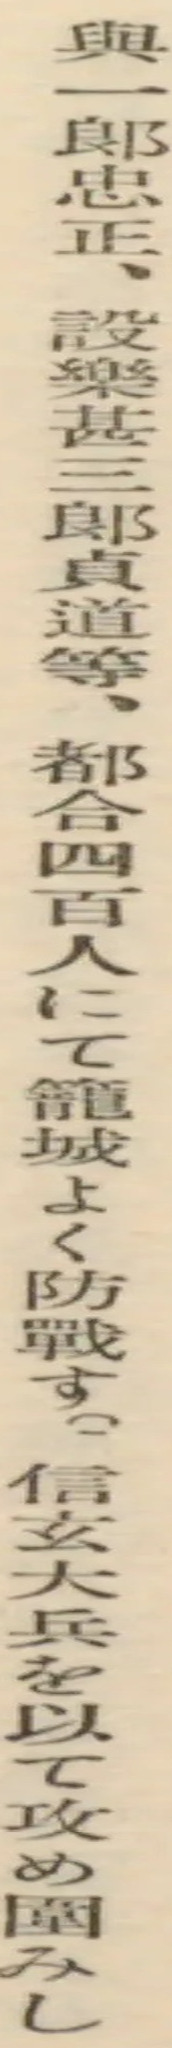與一郎忠正、設楽甚三郎貞道等、都合四百人にて籠城よく防戦す。信玄大兵を以て攻め囲みし
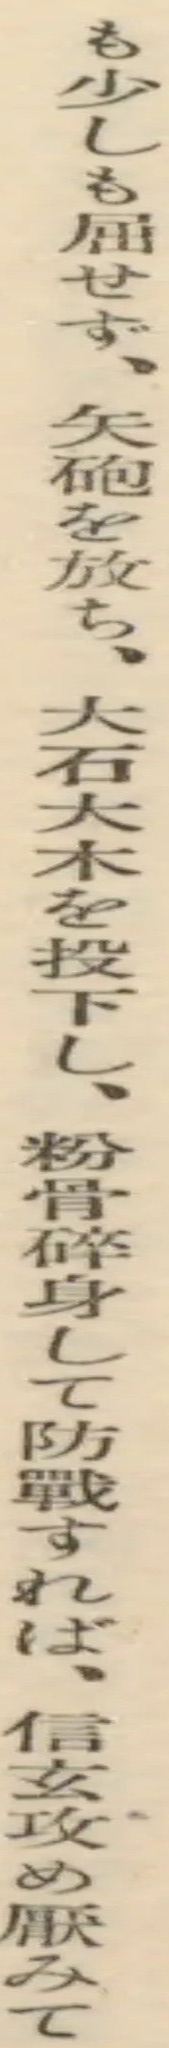も少しも屈せず、矢砲を放ち、大石大木を投下し、粉骨砕身して防戦すれば、信玄攻め厭みて
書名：東三河之古城
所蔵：国立国会図書館 National Diet Library, JAPAN
